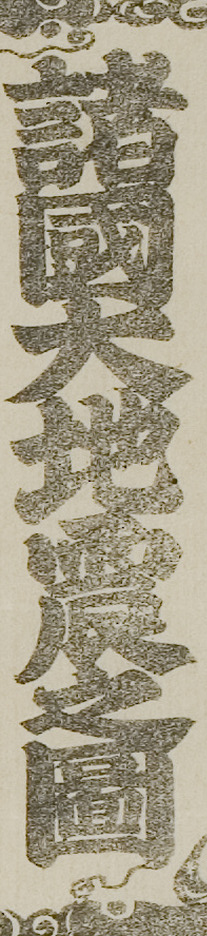諸国大地震之図
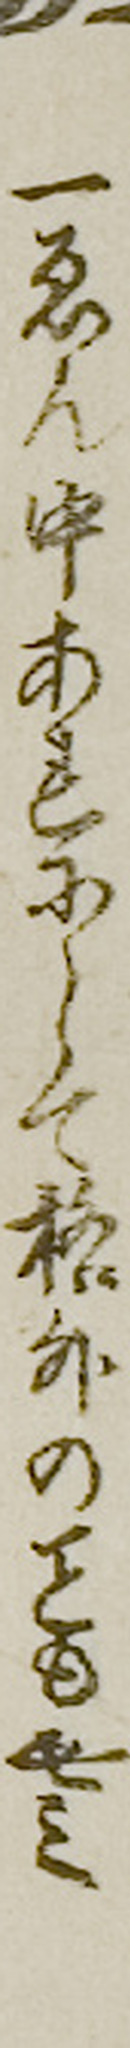一えん中あれにして格外のことも無之
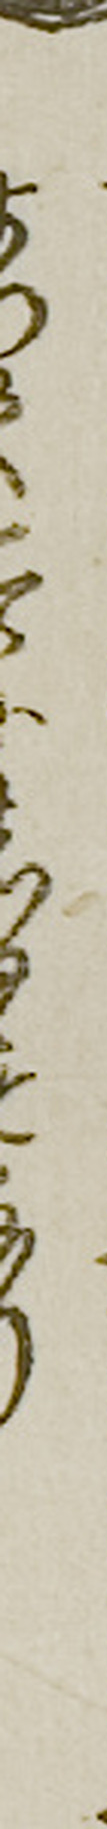よつてこゝにしるすなり
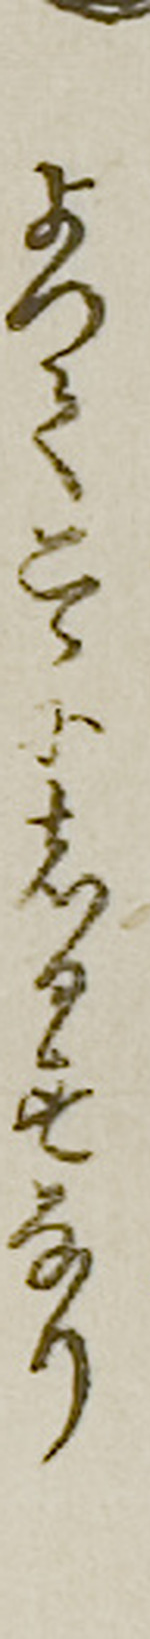よつてこゝにしるすなり
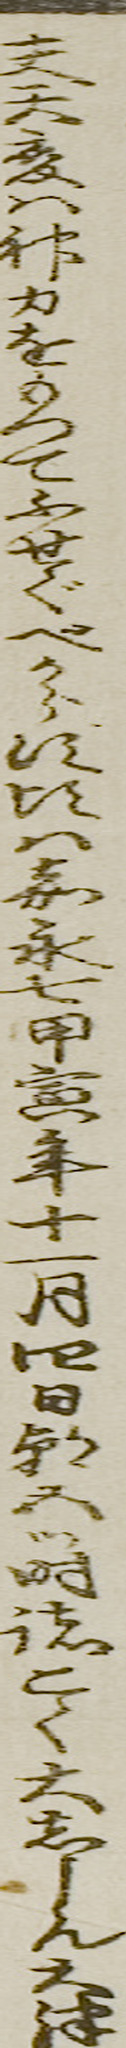夫転変は神力をもつてふせぐべからす頃は嘉永七甲寅年十一月四日朝五つ時諸こく大ししん大津
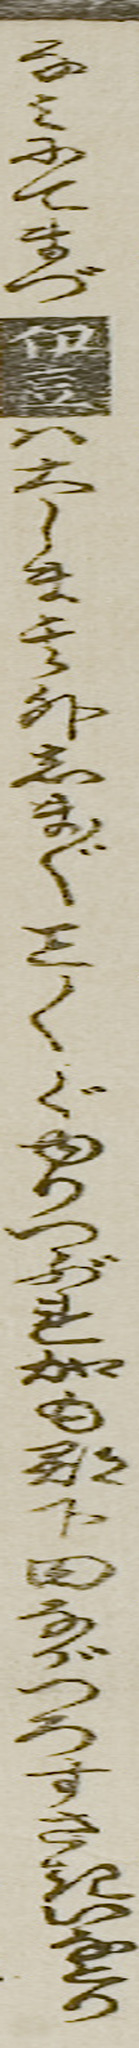なみにてまづ伊豆は大しま其外しま〴〵こと〳〵ぐゆりつぶれかも郡下田ながつろすさきいなとり
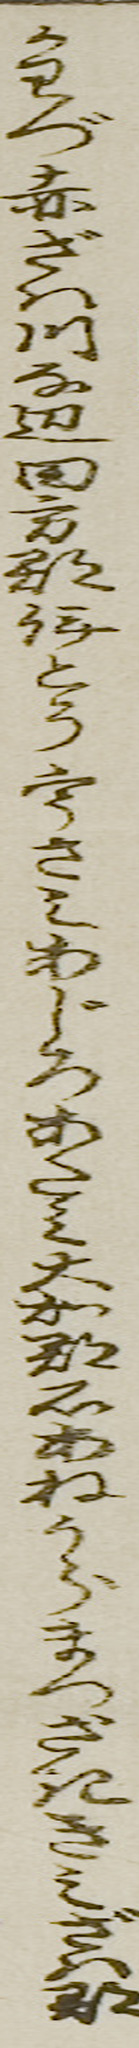かわづ赤さは川な辺田方郡伊とう宇さみあじろあたみ大加郡あねうらまつざききみざは郡
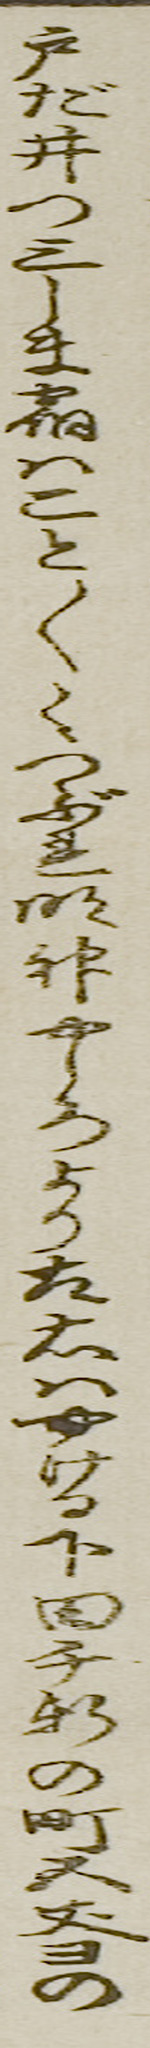戸だ井つ三しま宿はこと〳〵くつぶれ明神やしろより左右はやける下田千軒の町五丈ヨの
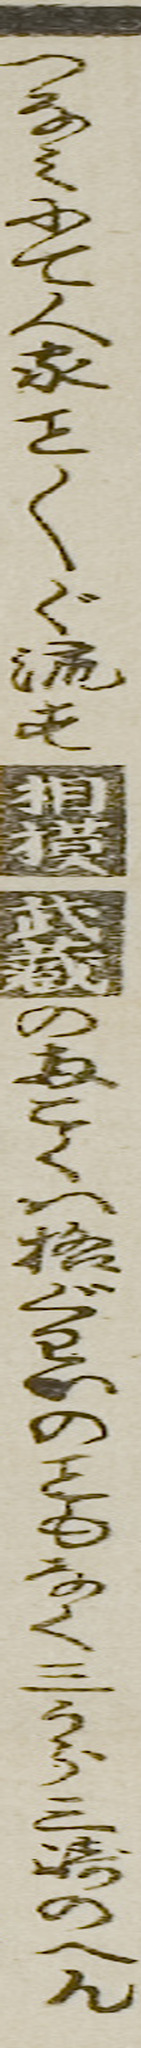つなみにて人家こと〳〵ぐ流す相模武蔵の両こくは格ぐわいのこともなく三うら三崎のへん
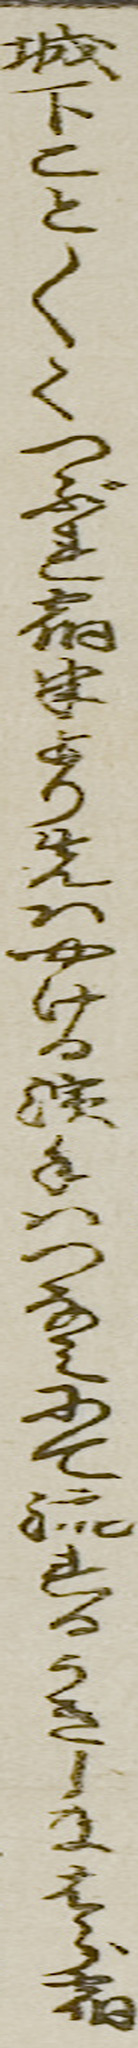城下こと〳〵くつぶれ宿半より先はやける浜手はつなみにて流れるうきしまはら宿
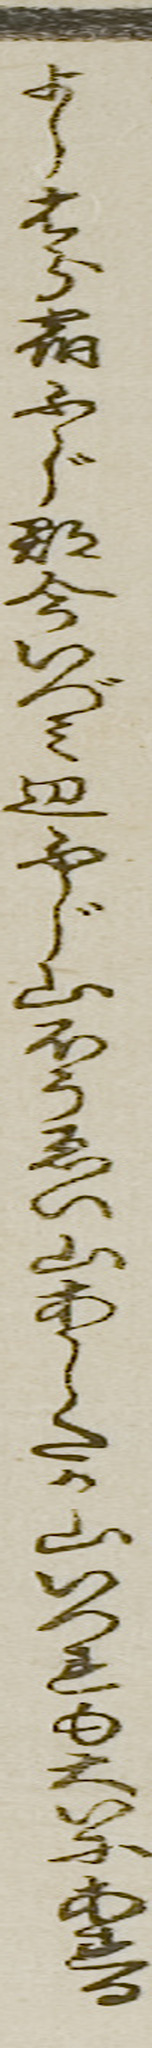よしはら宿ふじ郡今いづみ辺ふじ山ほうゑい山あしたか山いつれも大いにあれる
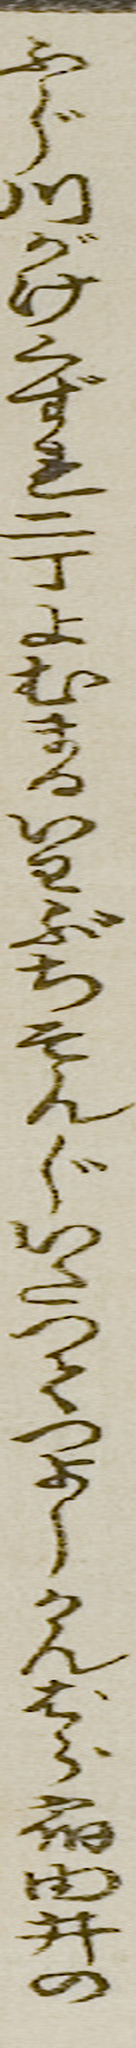ふじ川がけくずれ二丁よむまるいわぶちそんじいたつてつよしかんはら宿由井の
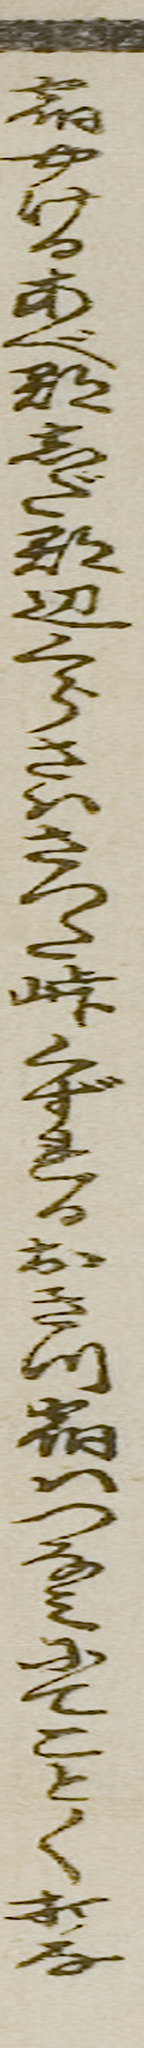宿やけるあべ郡しだ郡辺くらさはさつた峠くづれるおきつ宿はつなみにてこと〳〵打な
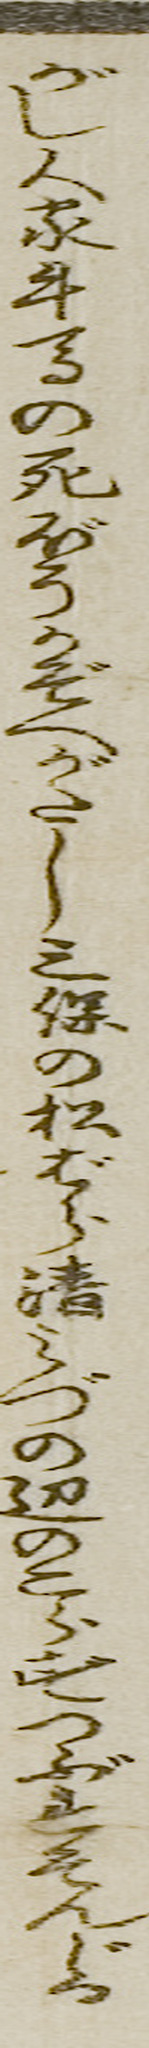がし人家牛馬の死ぼうかぞへがたし三保の松ばら清みづの辺のこらすつぶれそんじる
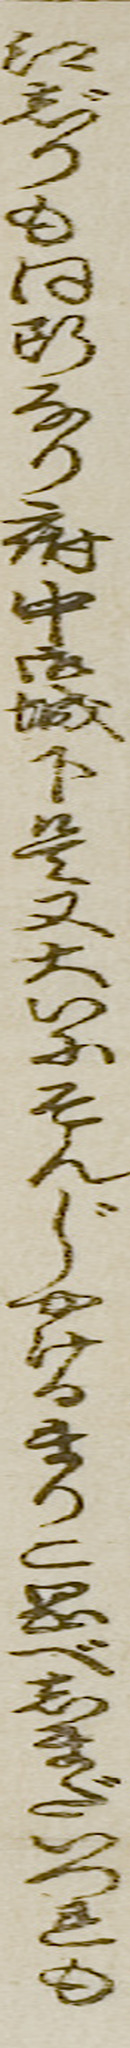えじりも同断なり府中御城下是又大いにそんじやけるまりこ岡べしまだいつれも
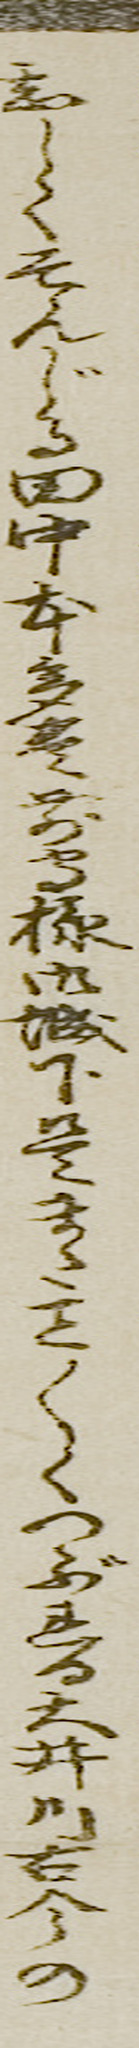甚しくそんじる田中本多豊前守様御城下是またこと〳〵くつぶれる大井川古今の
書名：諸国大地震之図
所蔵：東京大学総合図書館 General Library in the University of Tokyo, JAPAN
